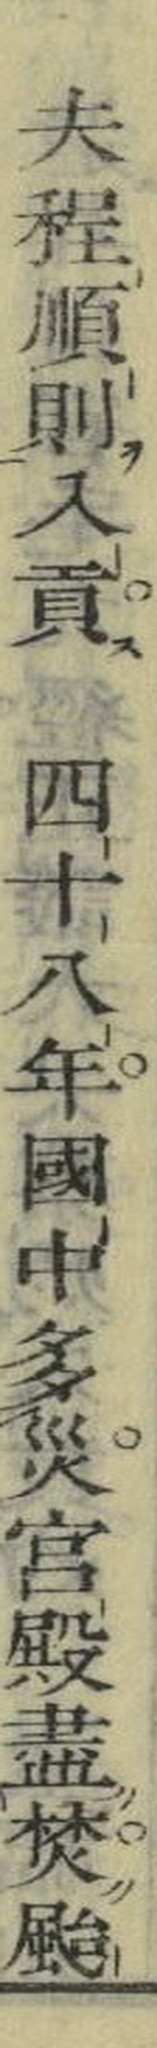夫程-順-則入-貢。四-十-八-年。国-中多災。宮-殿尽-焚。颱-
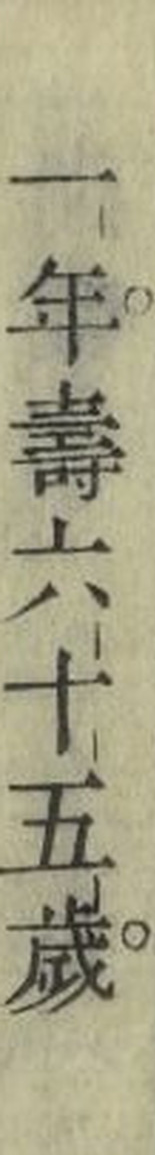一-年。寿六-十-五-歳。
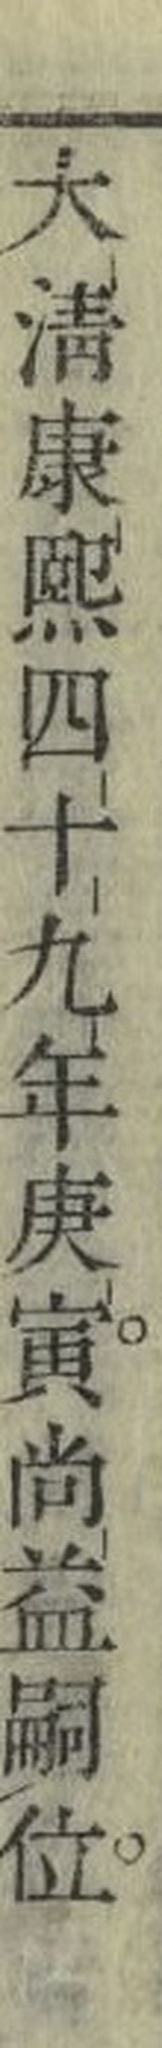大-清康-煕四-十-九-年庚-寅。尚-益嗣位。

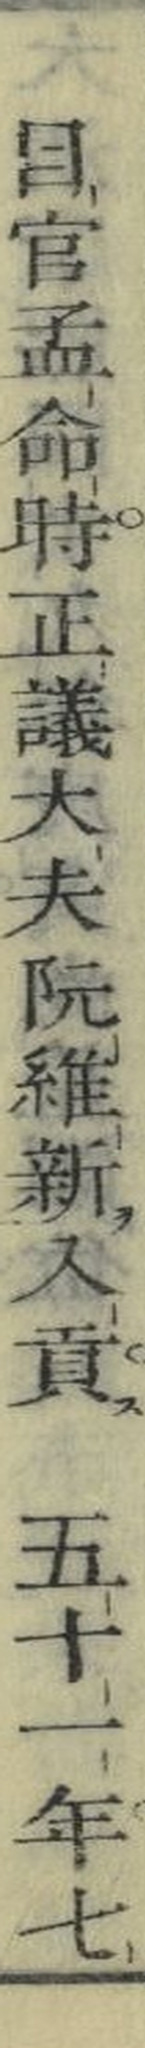目-官孟-命-時。正-議大-夫阮-維-新入-貢。五-十-一-年。七-
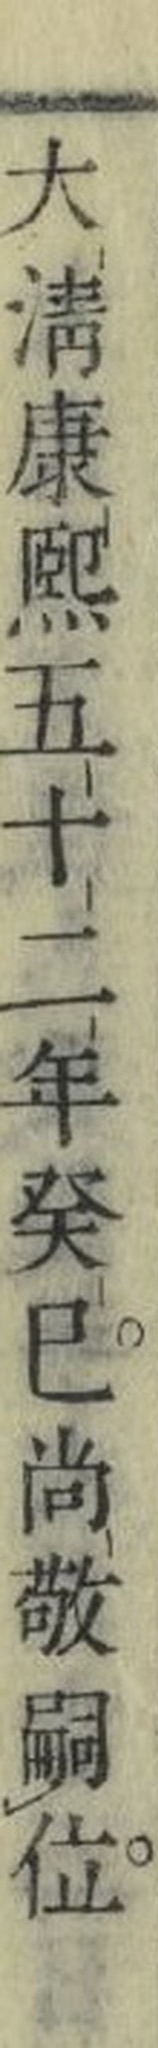大-清康-煕五-十-二-年癸-巳。尚-敬嗣位。
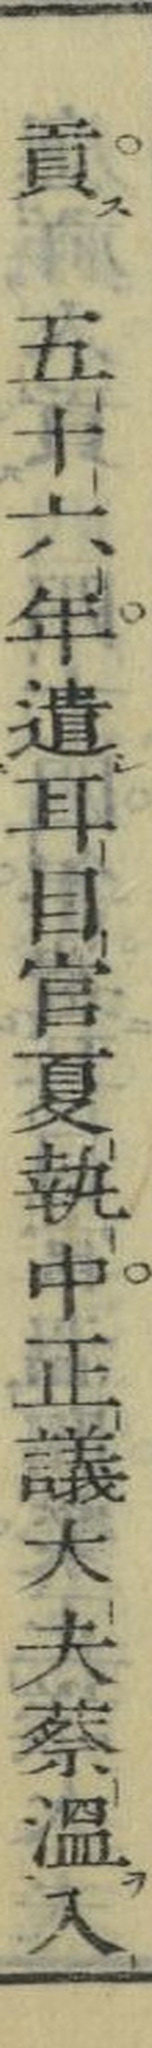貢。五-十-六-年。遣耳-目-官夏-執-中。正-議大-夫蔡-温入-
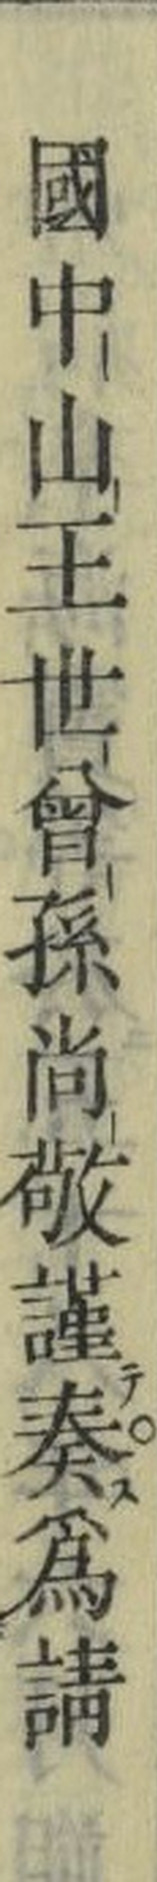国中-山-王世-曽-孫尚-敬謹奏。爲請

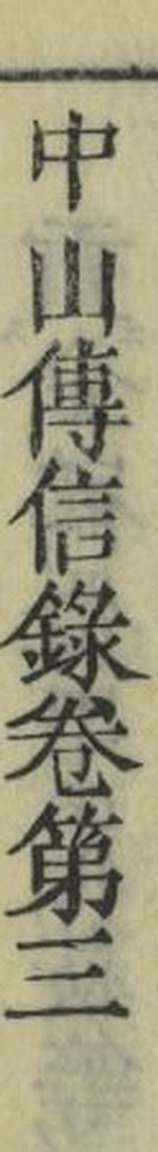中山伝信録巻第三
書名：中山伝信録 巻三
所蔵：University of the Ryukyus Library
